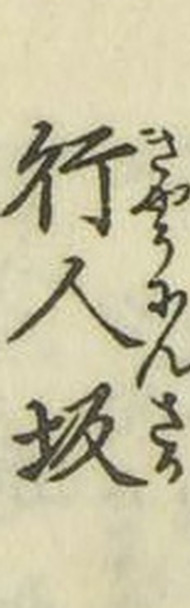行人坂

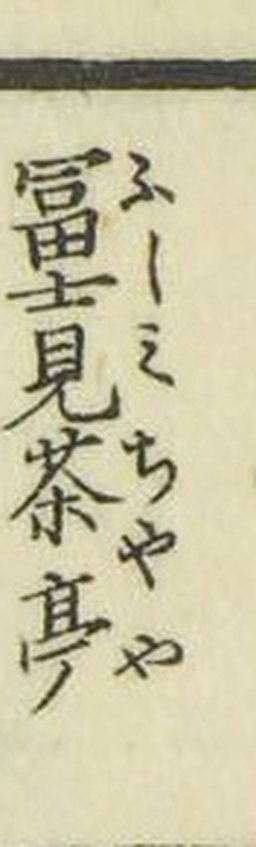冨士見茶亭
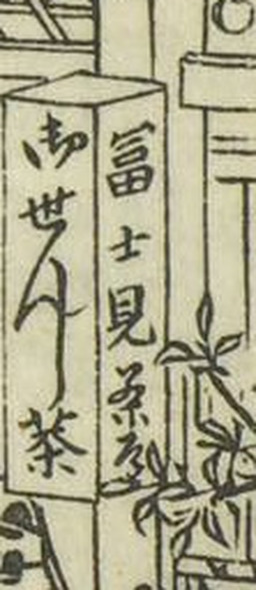冨士見茶亭
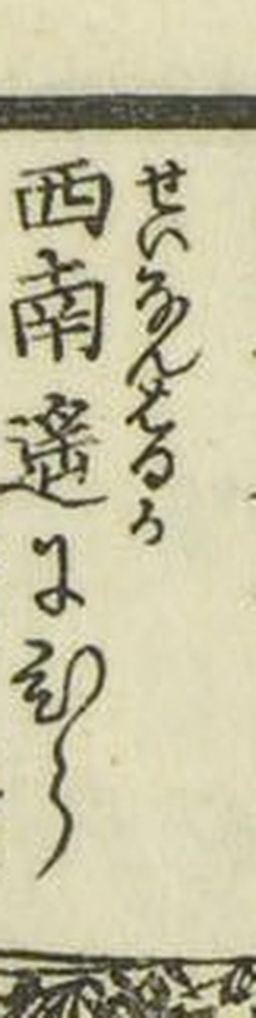西南遥にひら
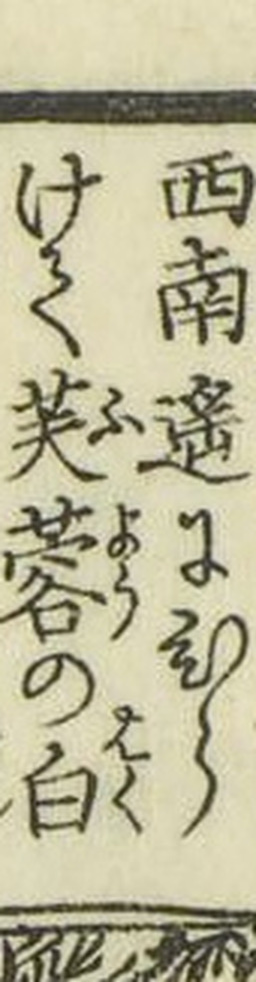けて芙蓉の白
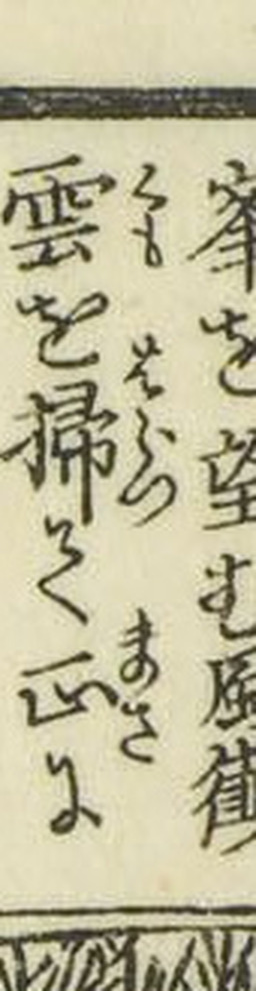雲を掃て正に
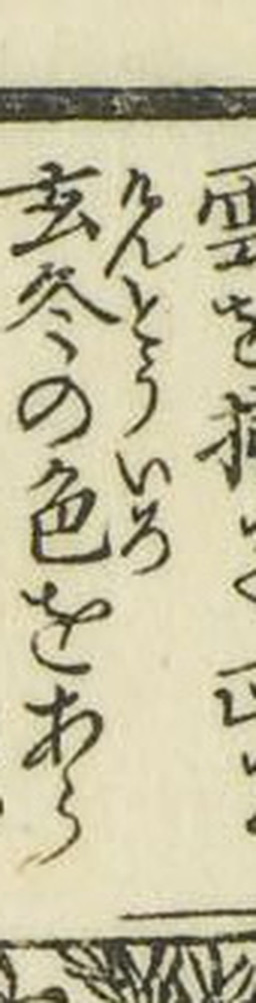玄冬の色をあら
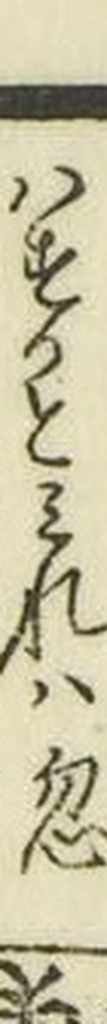はすかとみれは忽
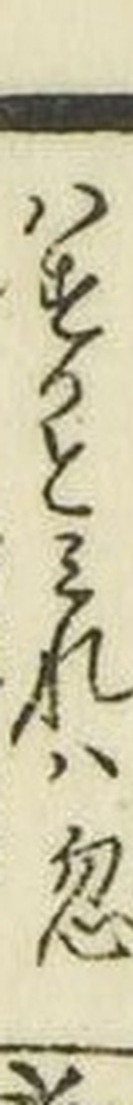はすかとみれは忽
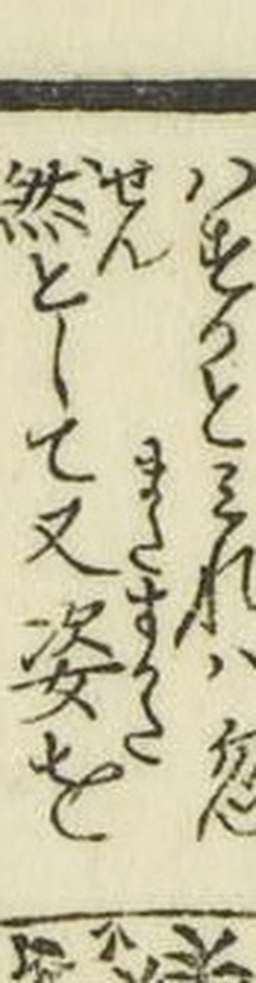然として又姿を
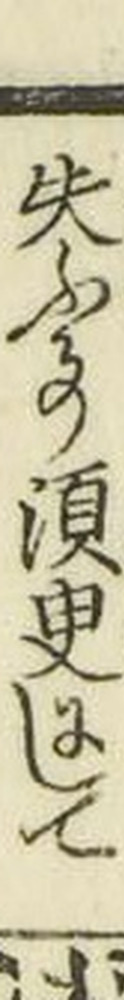失ふ事須臾にして
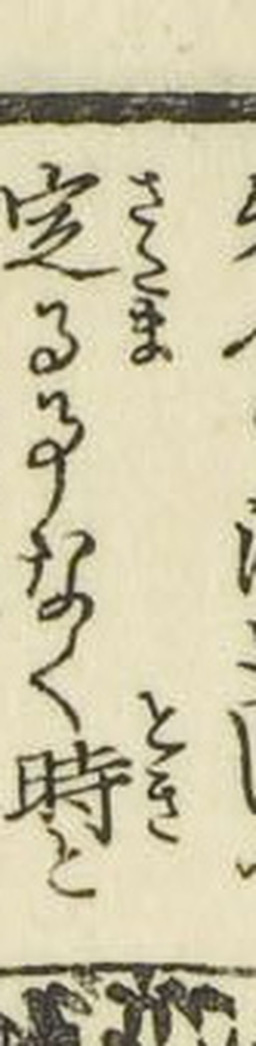定る事なく時と
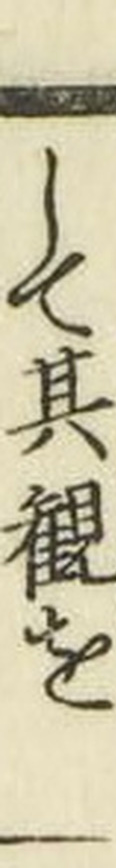して其観を
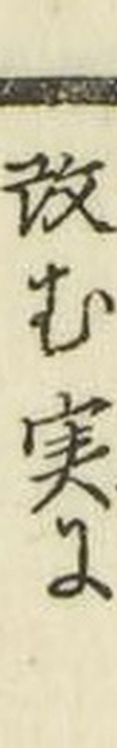改む実に
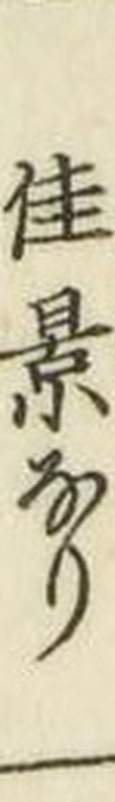佳景なり
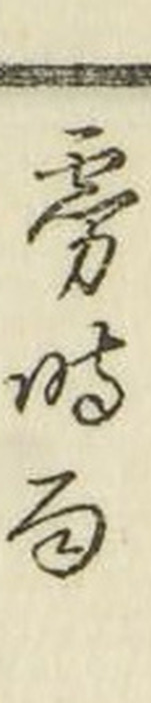雰時雨
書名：江戸名所図会 20巻 巻之7
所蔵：東京学芸大学教育コンテンツアーカイブ
